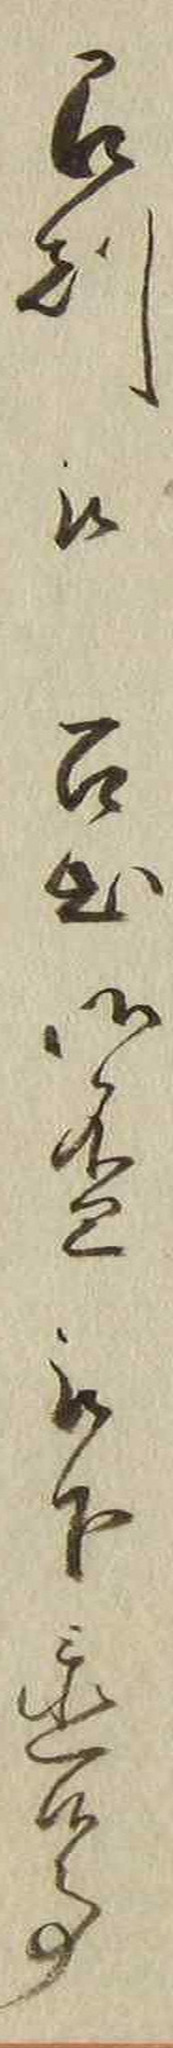即刻被召出御盃被下置候事
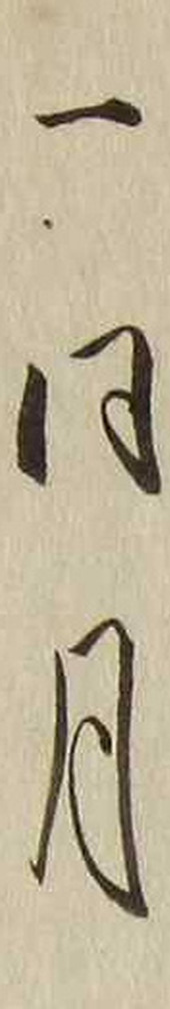一同月
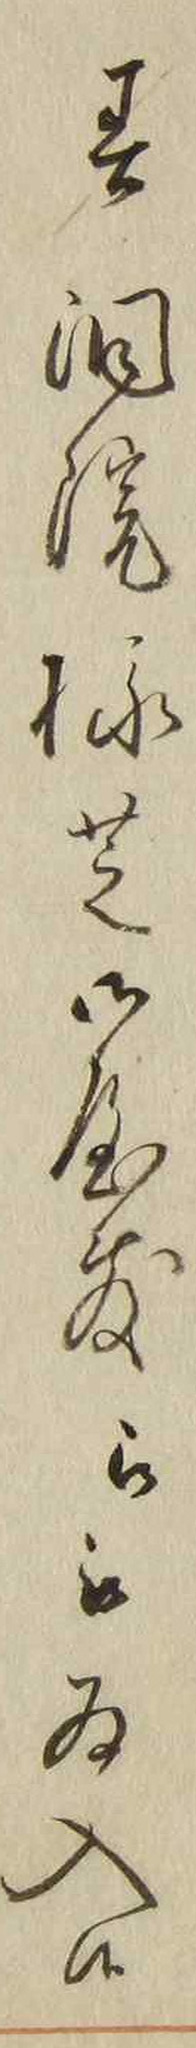春洞院様芝御屋敷江被為入候

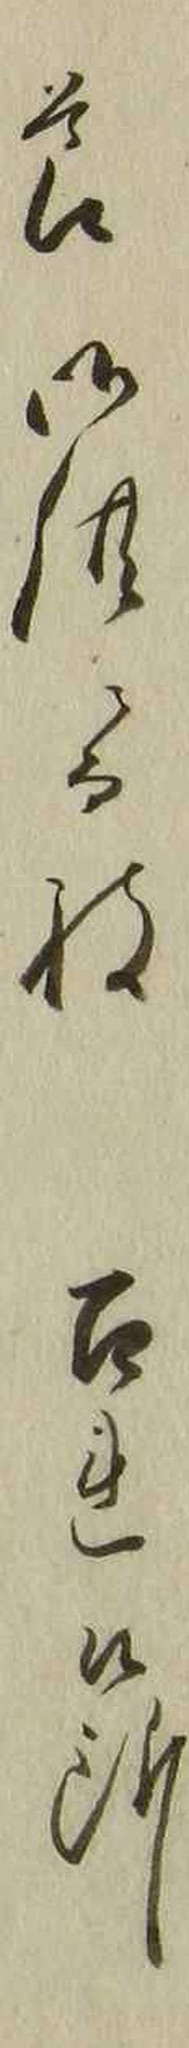節御供ニ而被召連候所
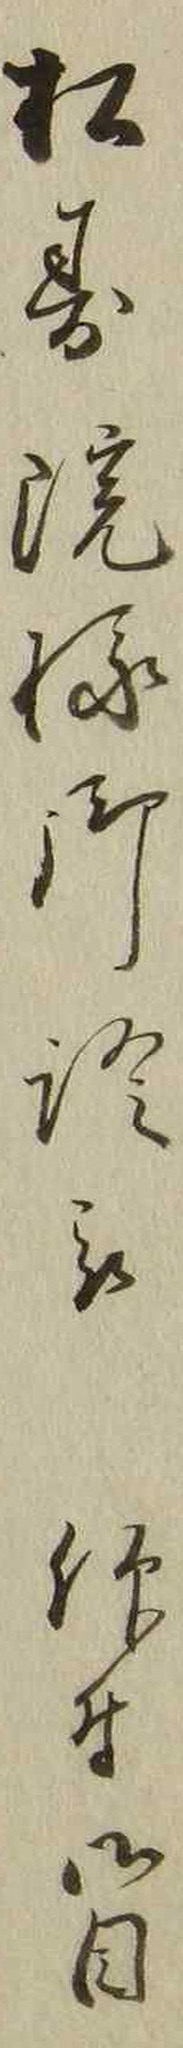松寿院様御診被仰付御目
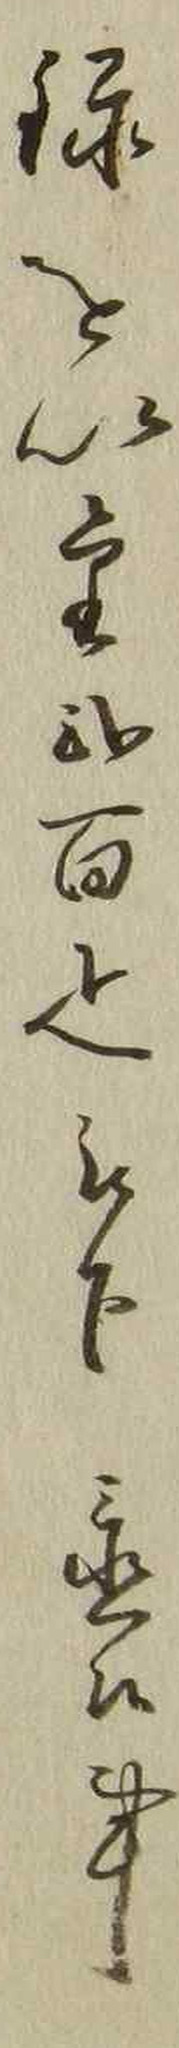録を以金弐百疋被下置候事
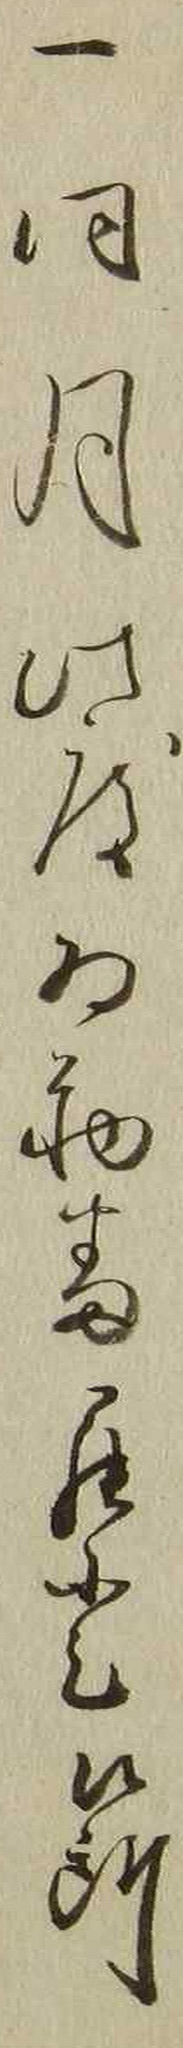一同月此度為勤番罷登候所
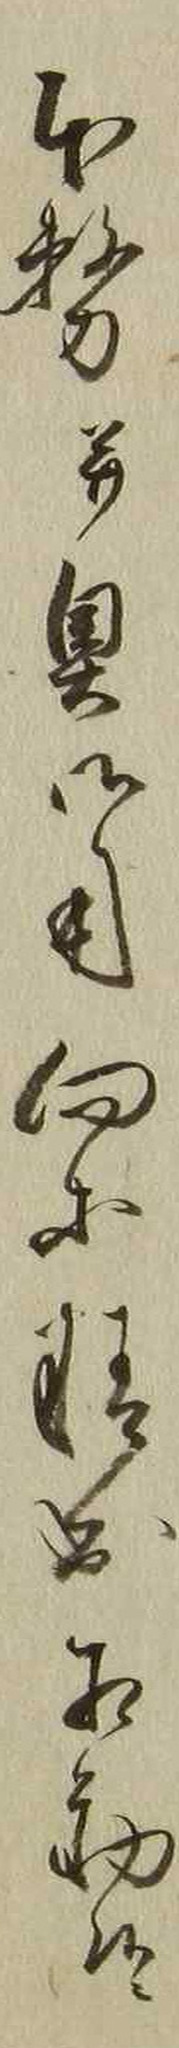本務并奥御用向等精出相勤候ニ
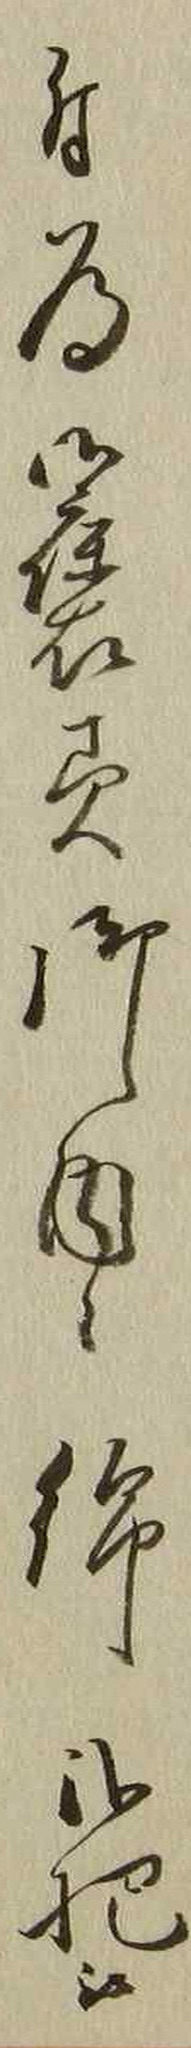付為御褒美御内々綿弐把被
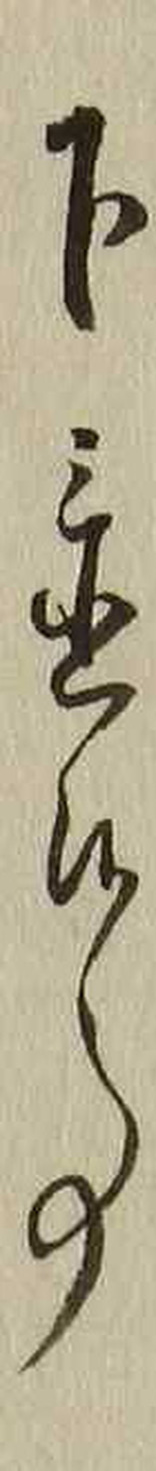下置候事
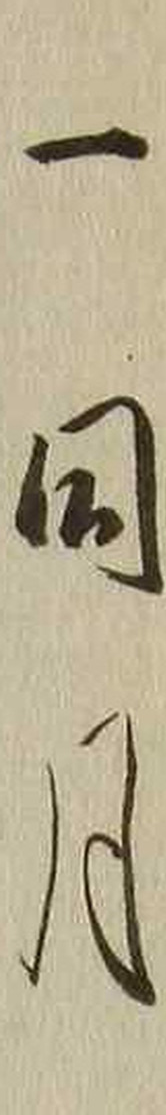一同月
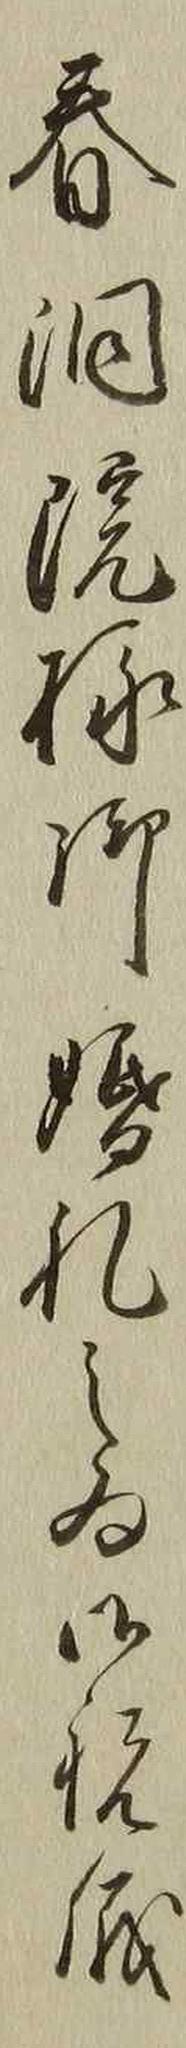春洞院様御婚礼之為御祝儀
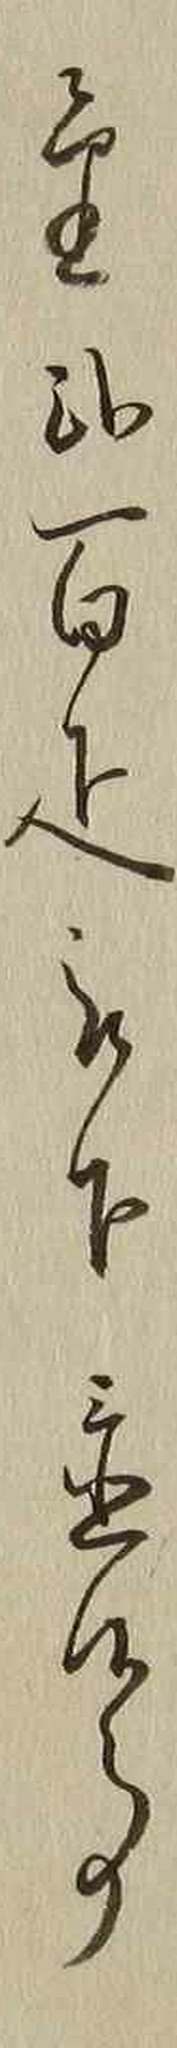金弐百疋被下置候事
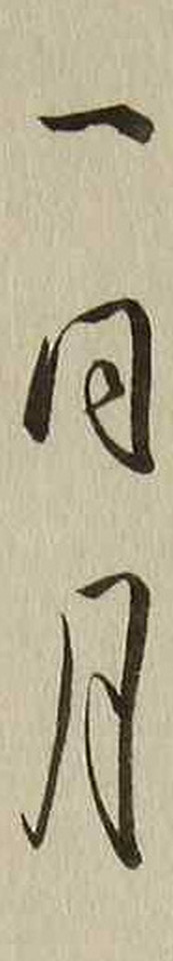一同月
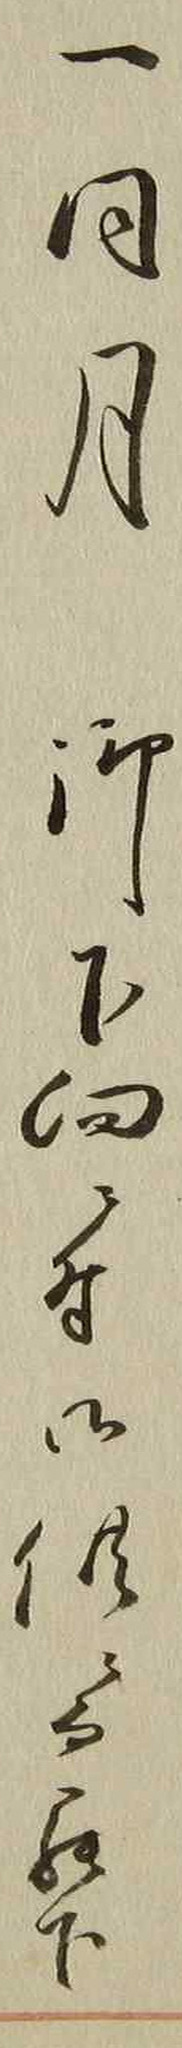一同月御下向ニ付御供ニ而罷下
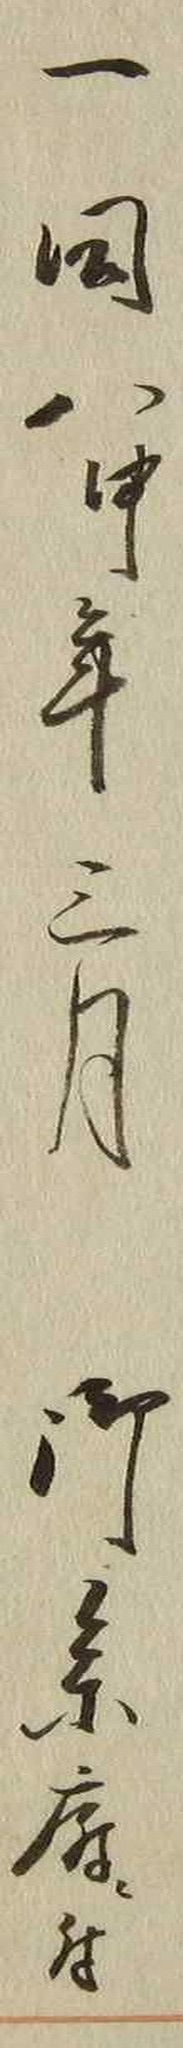一同八申年三月御参府ニ付
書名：諸士系譜　巻之68　を之部2
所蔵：会津若松市立会津図書館
